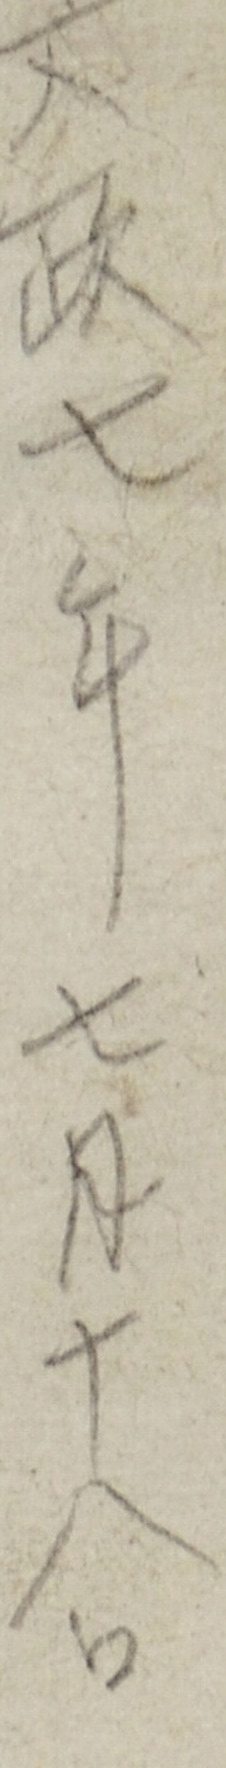文政七年七月十八日
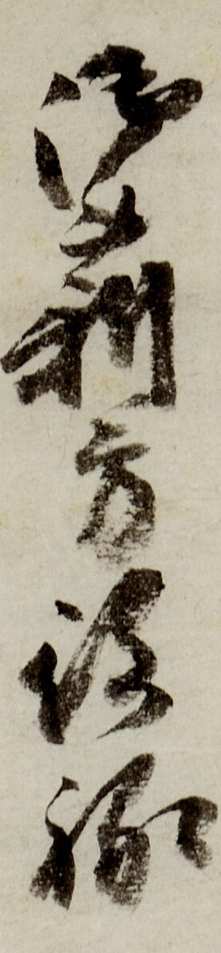御薪方役禄
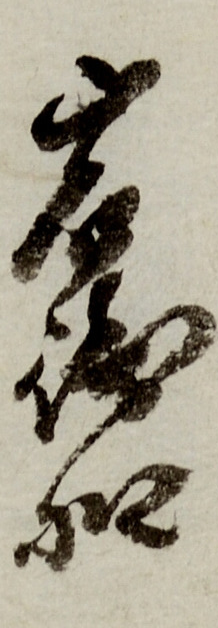岩崎扣
